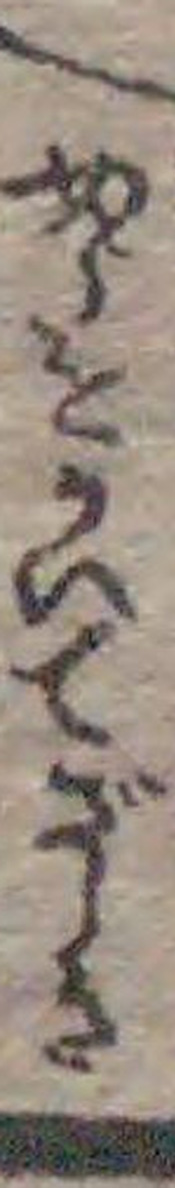女郎をかいてざしき
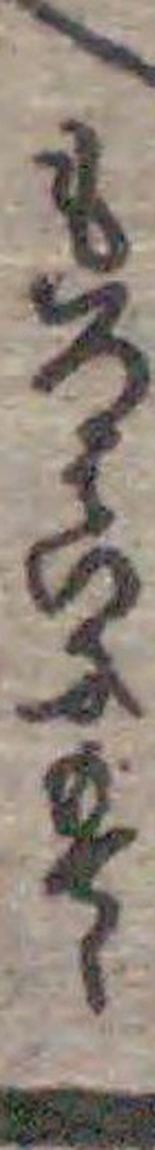もいつはいにもてゝ
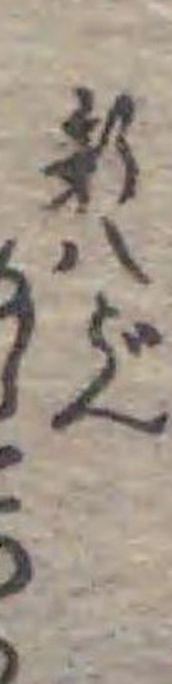新八どん
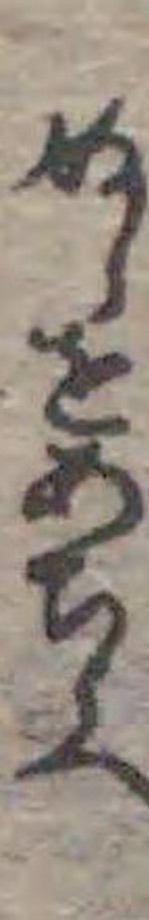ぬしをあちらへ
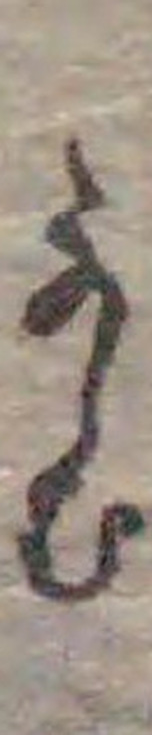たのしむ
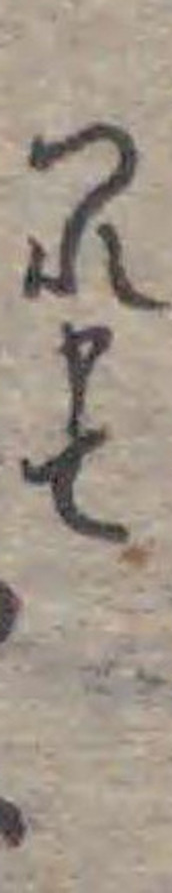つれ申て
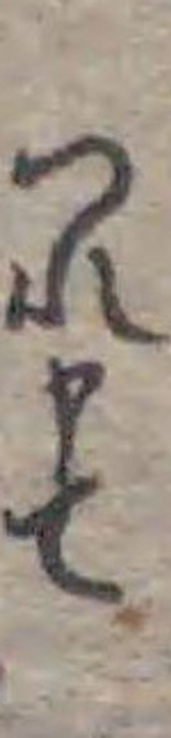つれ申て
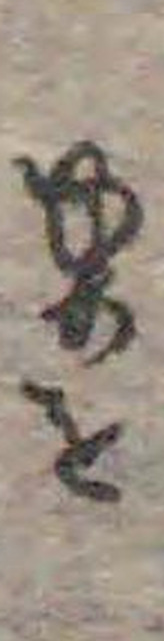ゆめを
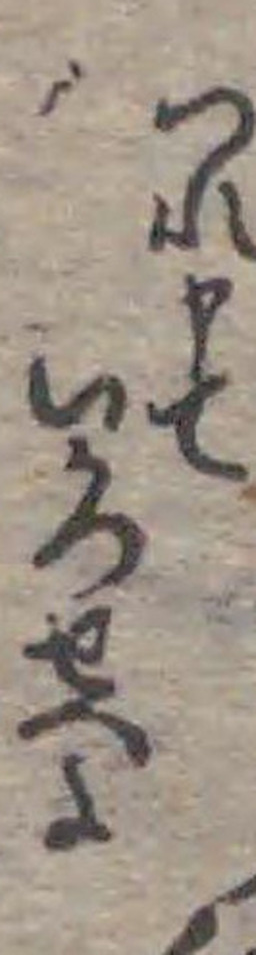いかつせへよ
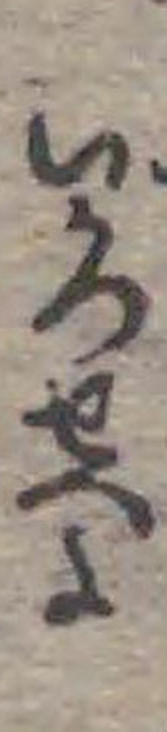いかつせへよ
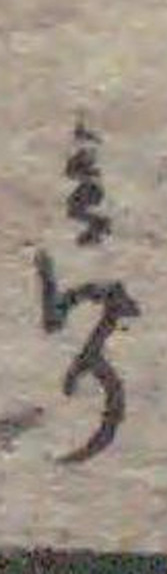みけり
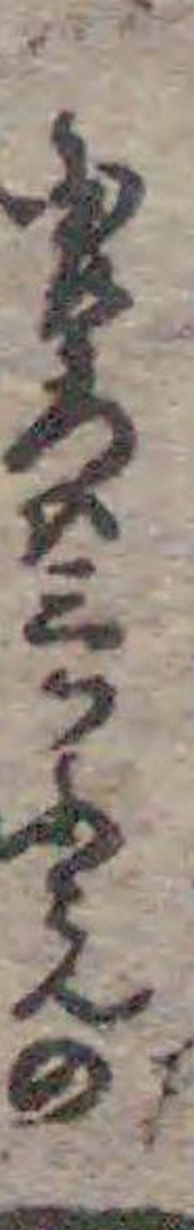国左衛門は三ツふとんの
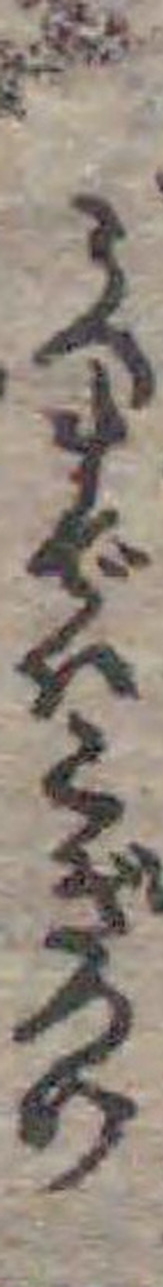うへまではこぎつけ
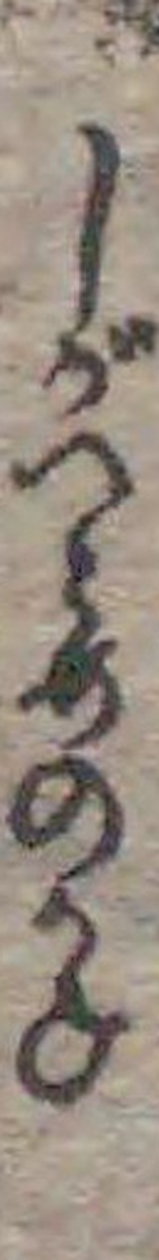しがつとめのかね
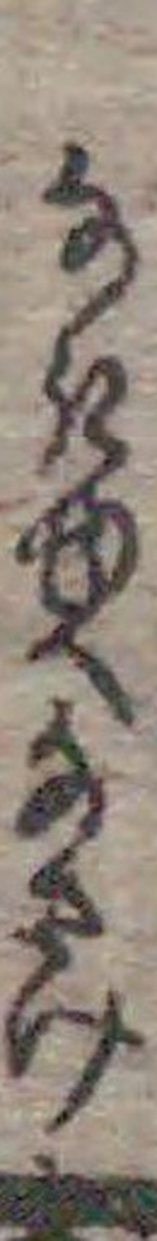なきゆへなさけ
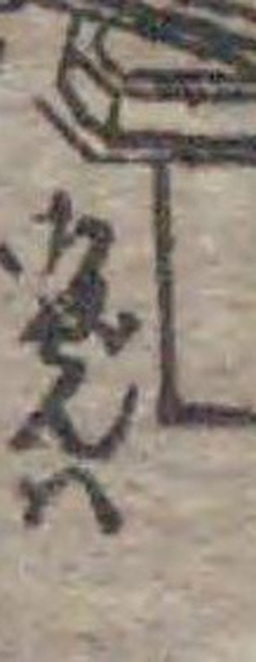御ぜんは
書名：見徳一炊夢 : 3巻
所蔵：国立国会図書館 National Diet Library, JAPAN
